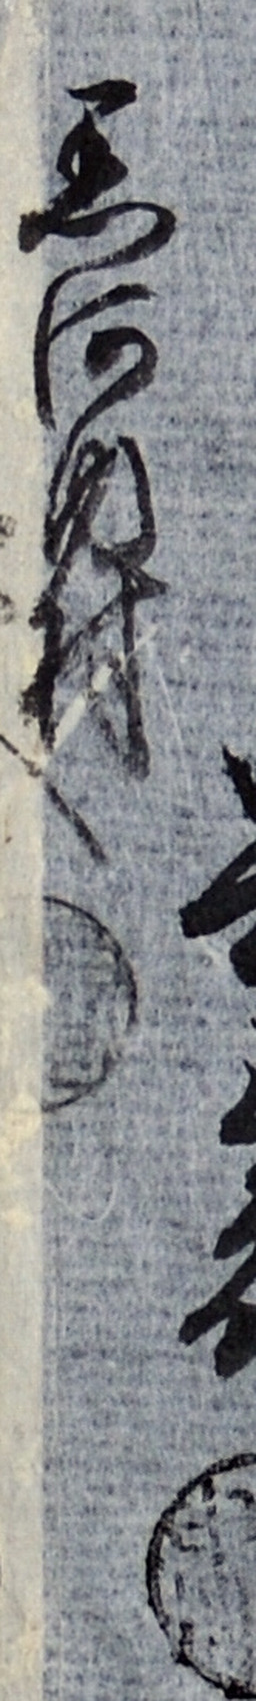黒河内村
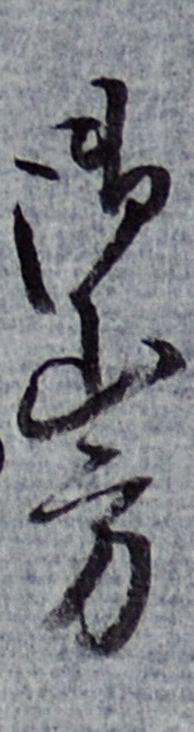御山方
